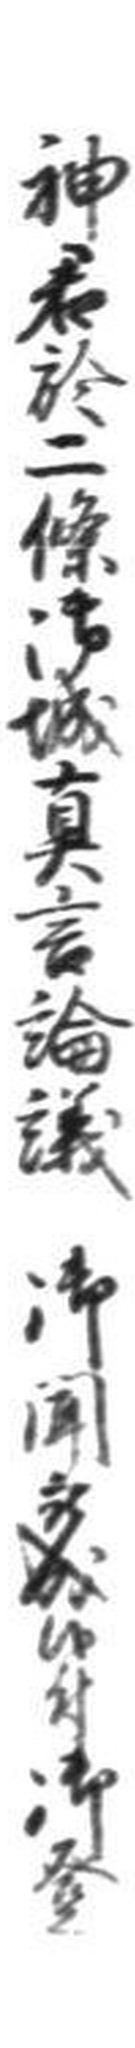神君於二條御城真言論議御聞被成候付御登

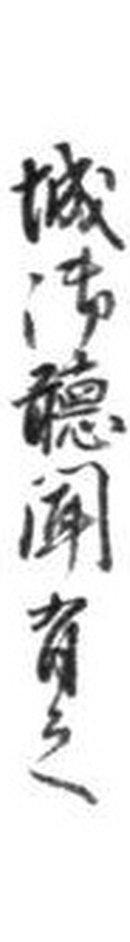城御聴聞有之
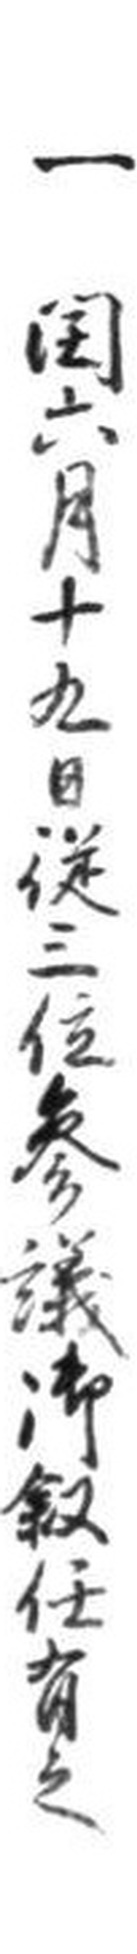一閏六月十九日従三位参議御叙任有之
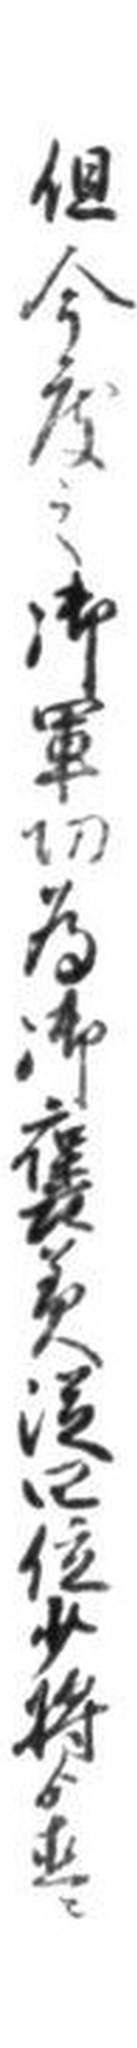但今度之御軍功為御褒美従四位少将ゟ直ニ
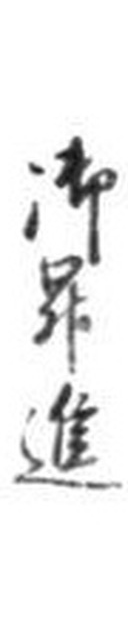御昇進
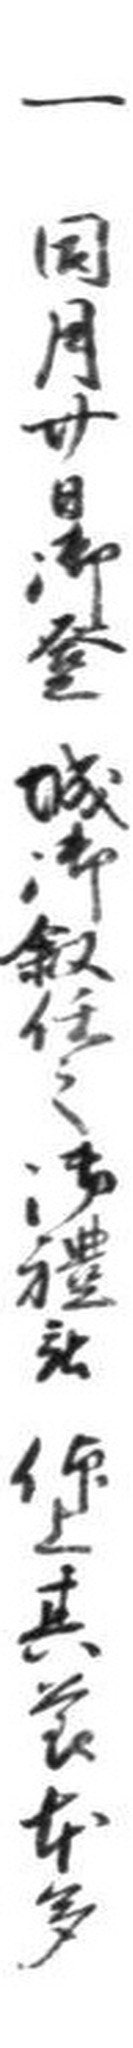一同月廿日御登城御叙任之御礼被仰上其節本多
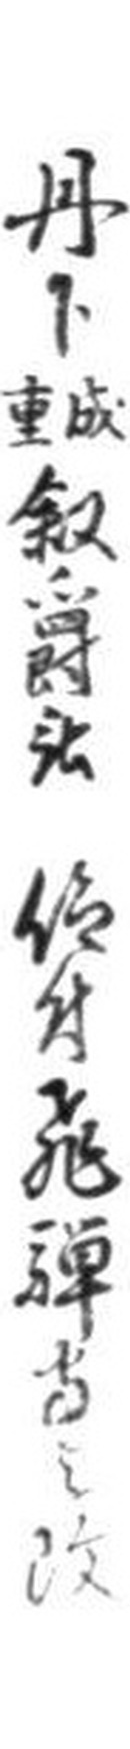重叙爵被仰付飛騨守与改
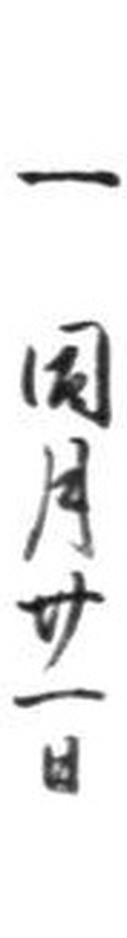一同月廿一日
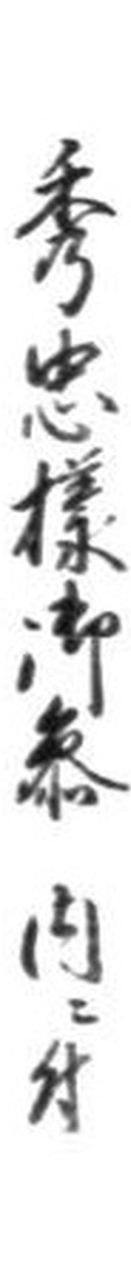秀忠様御参内ニ付
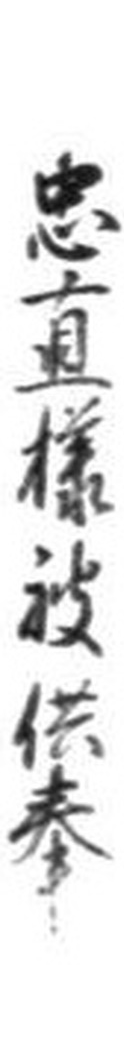忠直様被供奉
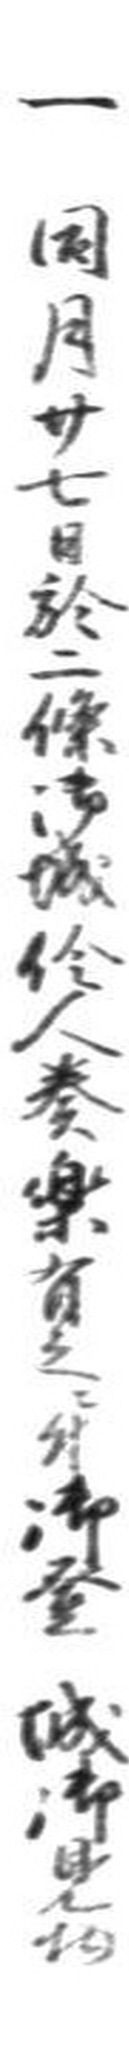一同月廿七日於二條御城伶人奏楽有之ニ付御登城御見物
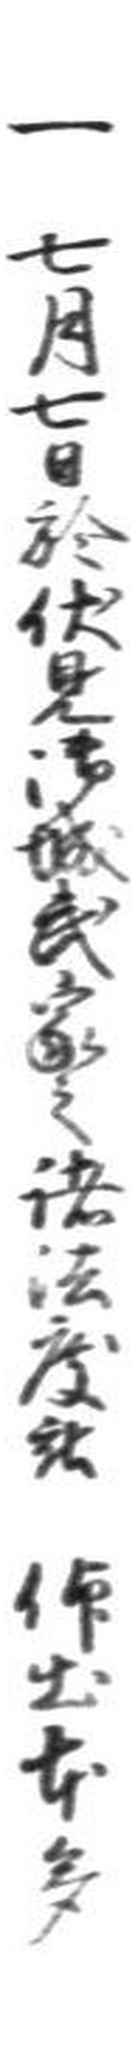一七月七日於伏見御城武家之諸法度被仰出本多
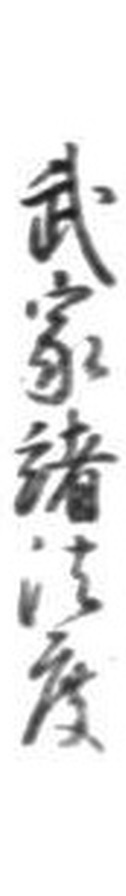武家諸法度
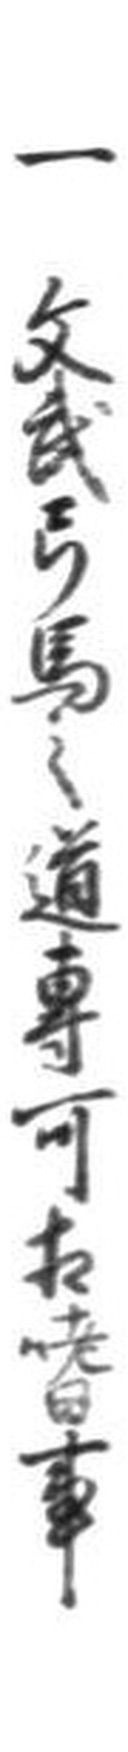一文武弓馬之道専可相嗜事
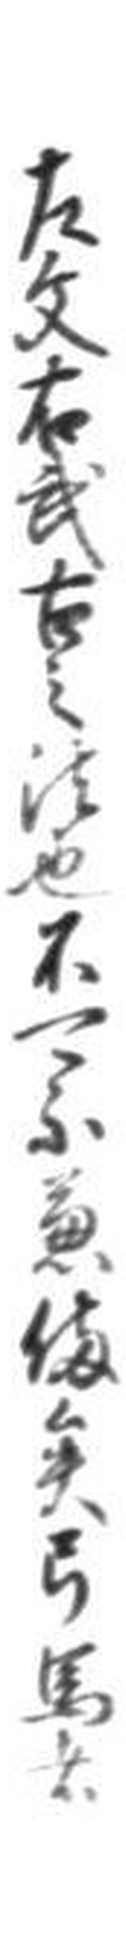左文右武古之法也不可不兼備矣弓馬者
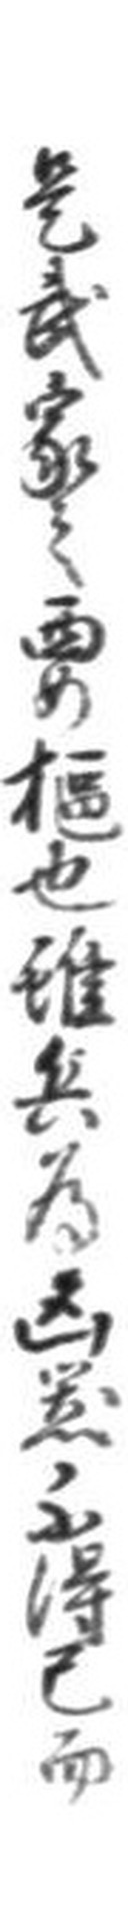是武家之要枢也雖兵為凶器不得已而
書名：家譜 二 忠直公 従文禄四年到慶安四年
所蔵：福井県文書館 Fukui Prefectural Archives
